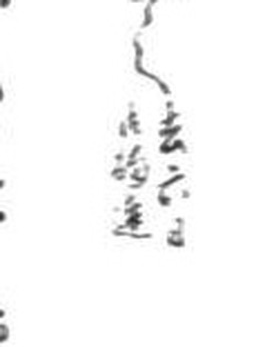御触達
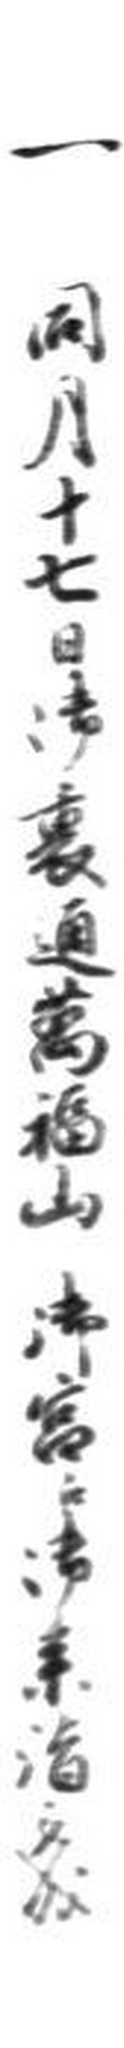一同月十七日御裏通万福山御宮江御参詣被成
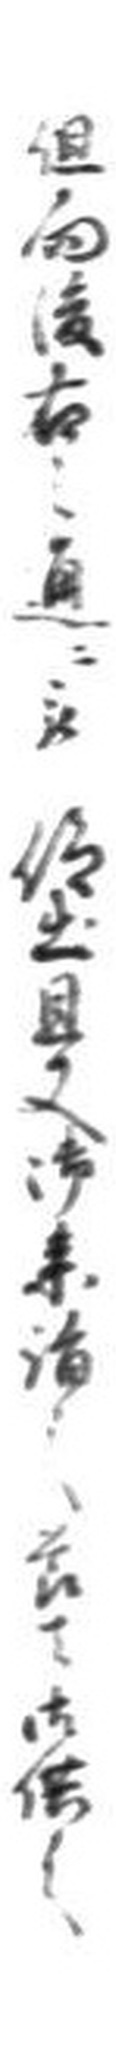但向後右之通ニ被仰出且又御参詣之節者御供之
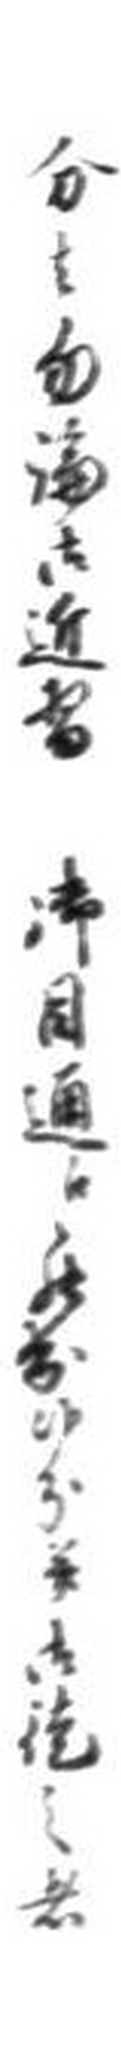分者勿論御近習御目通江罷出候分并御徒之者
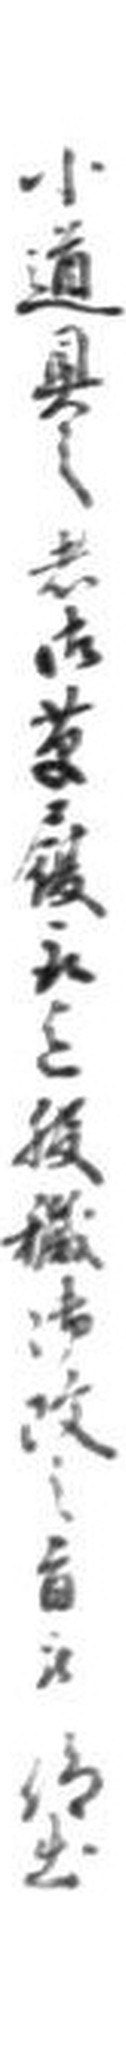小道具之者御草履取迄服穢御改之旨被仰出

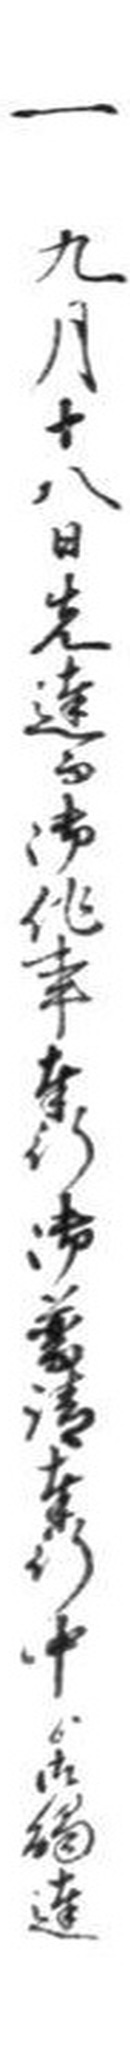一九月十八日先達而御作事奉行御普請奉行中ゟ御触達
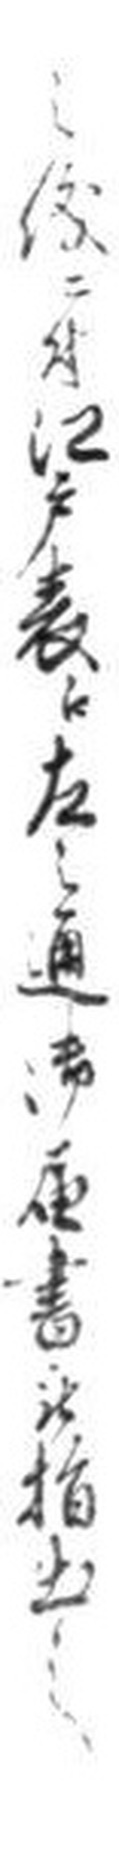之儀ニ付江戸表江左之通御届書被指出之
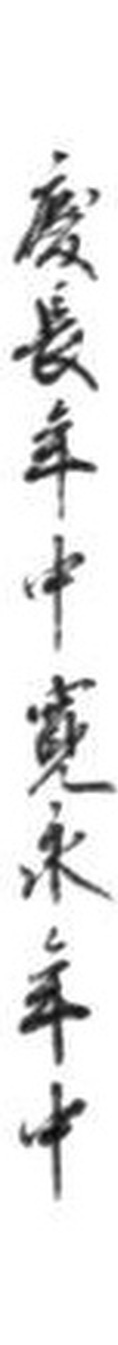慶長年中寛永年中
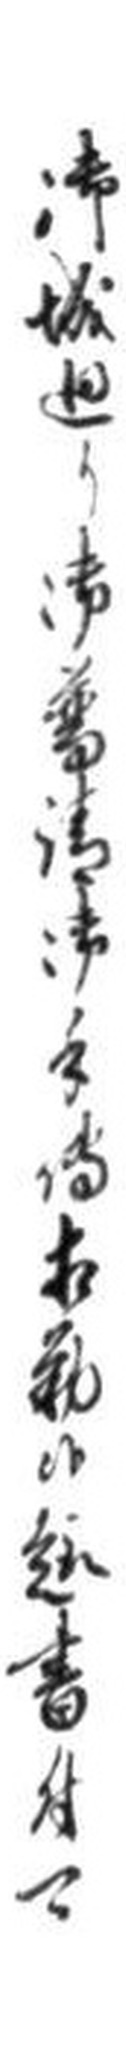御城廻り御普請御手伝相勤候趣書付可
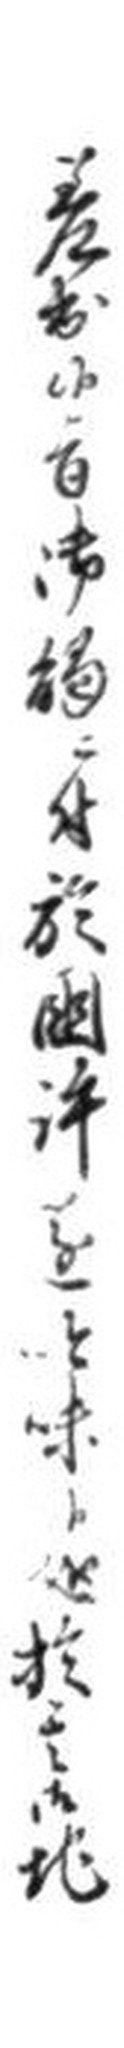差出候旨御触ニ付於国許遂吟味候処於其御地
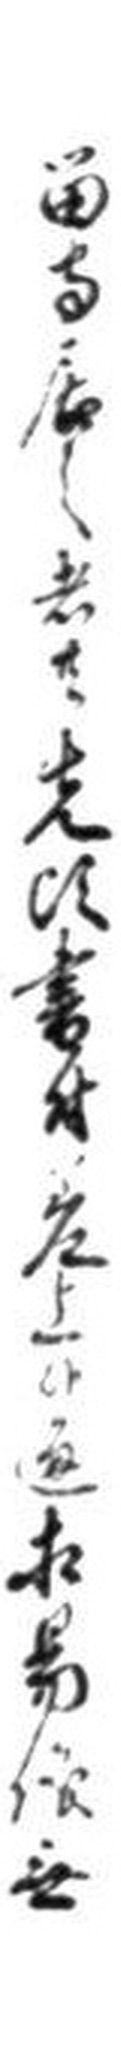留守居之者共先頃書付差上候通相易儀無
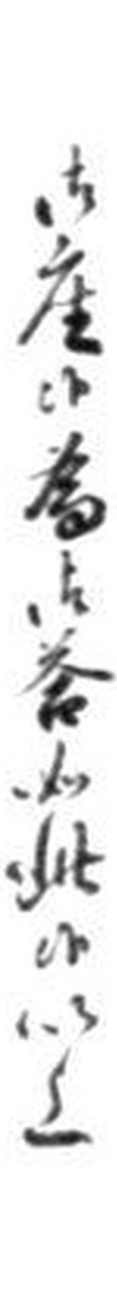御座候為御答如此候以上
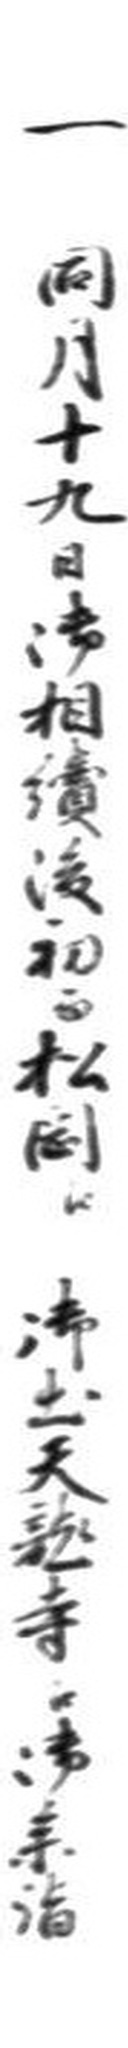一同月十九日御相続後初而松岡江御出天龍寺江御参詣
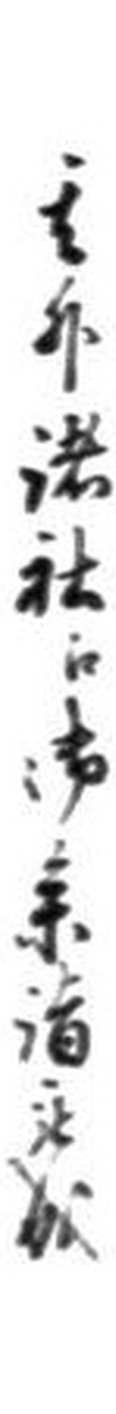其外諸社江御参詣被成
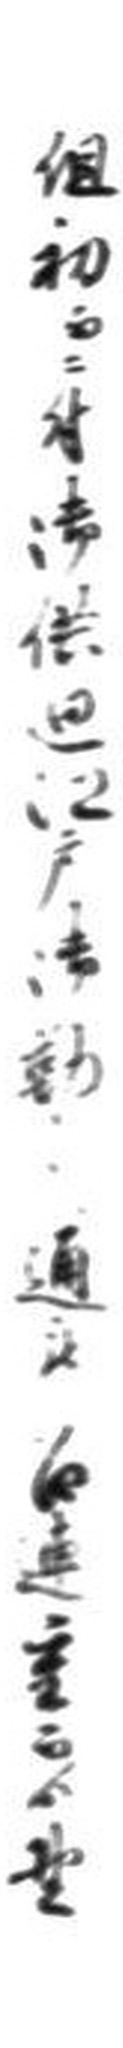但初而ニ付御供廻江戸御勤之通被召連重而ゟ野
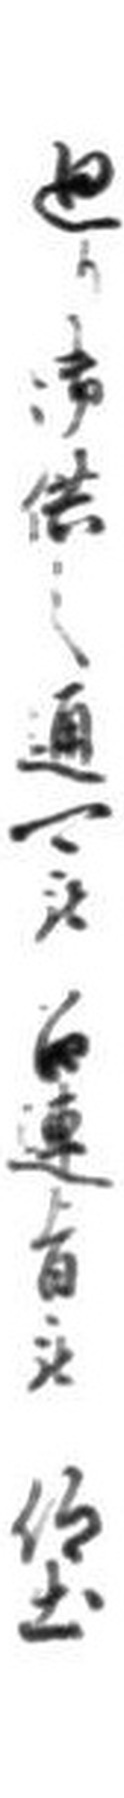廻り御供之通可被召連旨被仰出
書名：家譜 三十五 宗昌公 従享保六年到同七年
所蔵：福井県文書館 Fukui Prefectural Archives
